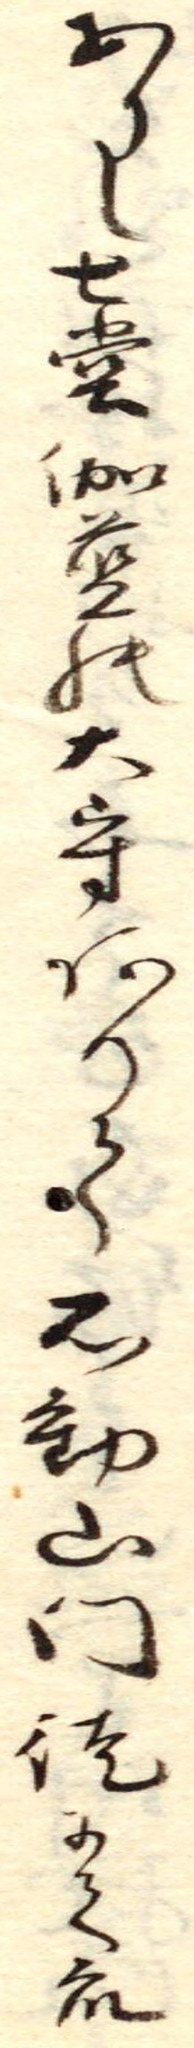ありし七堂伽藍の大寺ありて石動山門徒にて衆
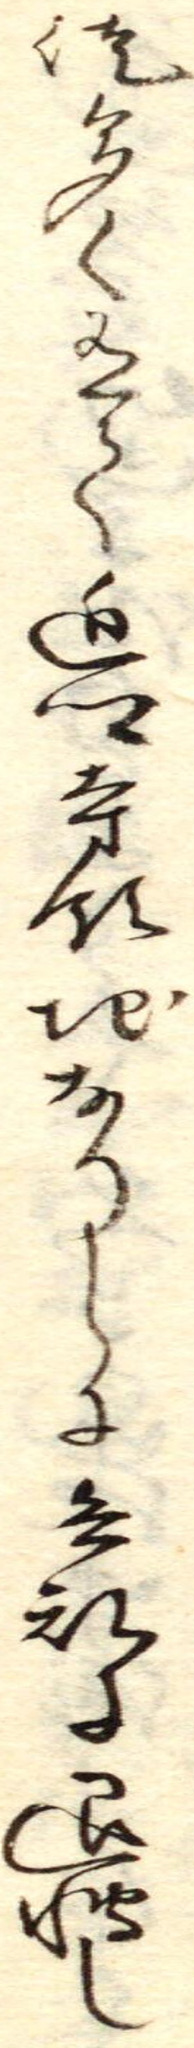徒多く有て近郷寺領地なりしに兵乱に退転し
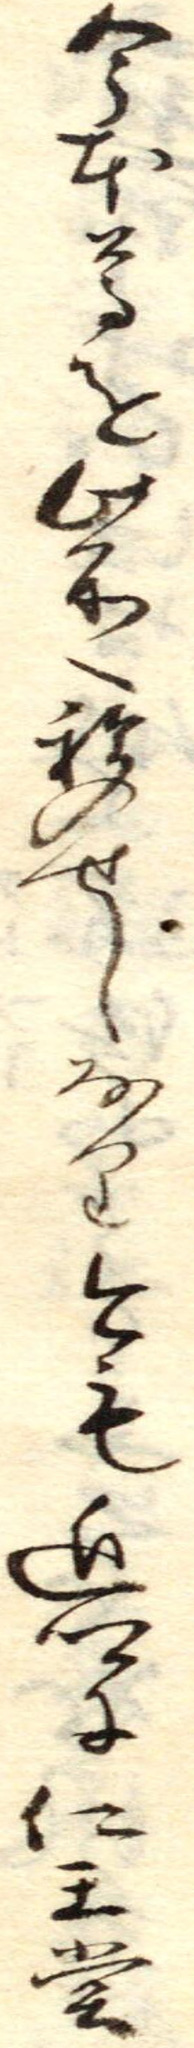今本尊を此所へ移せしなり今も近郷に仁王堂
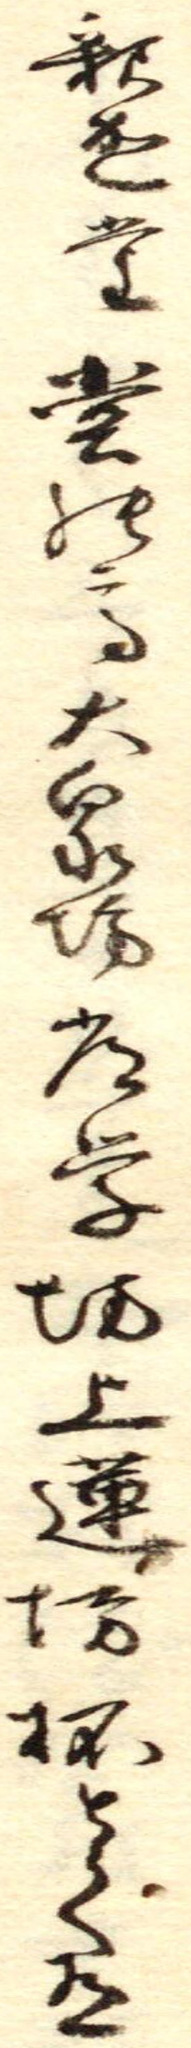釈迦堂堂の寺大泉坊常学坊上蓮坊抔とて有

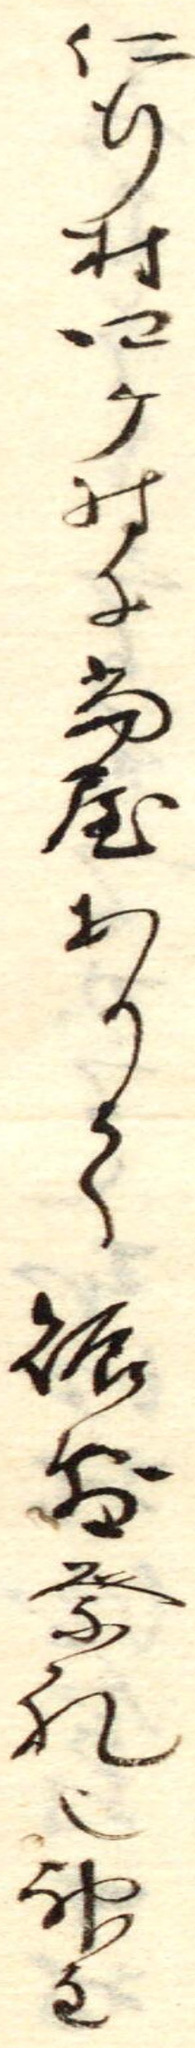仁行村四ヶ村に当屋ありて賑敷祭礼也神主
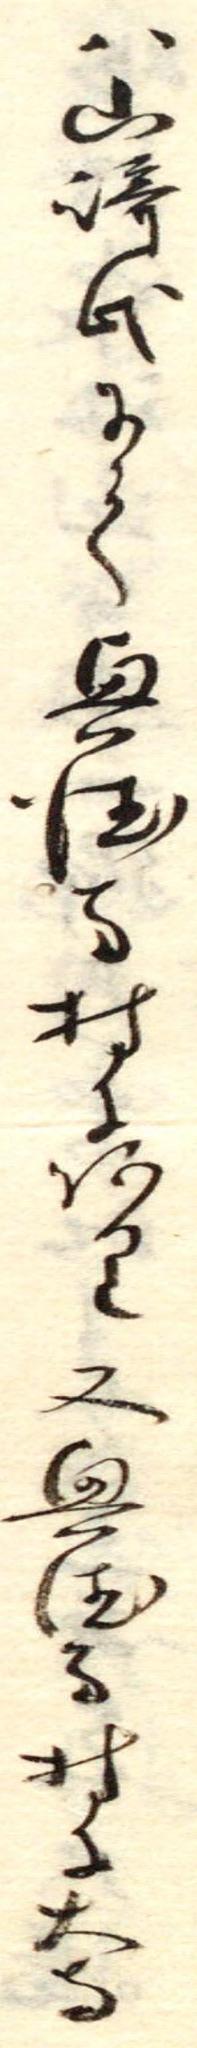は山崎氏にて興徳寺村にあり又興徳寺村に大寺
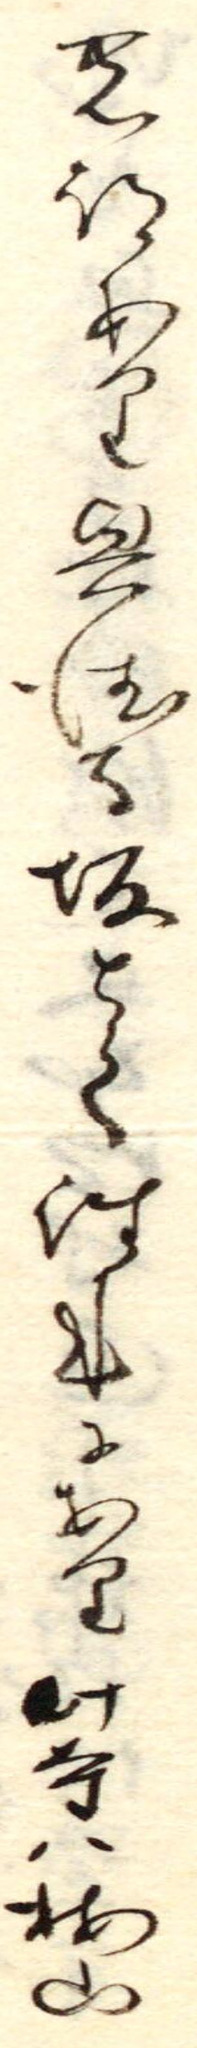の跡あり興徳寺坂とて往来にあり此寺は梅山
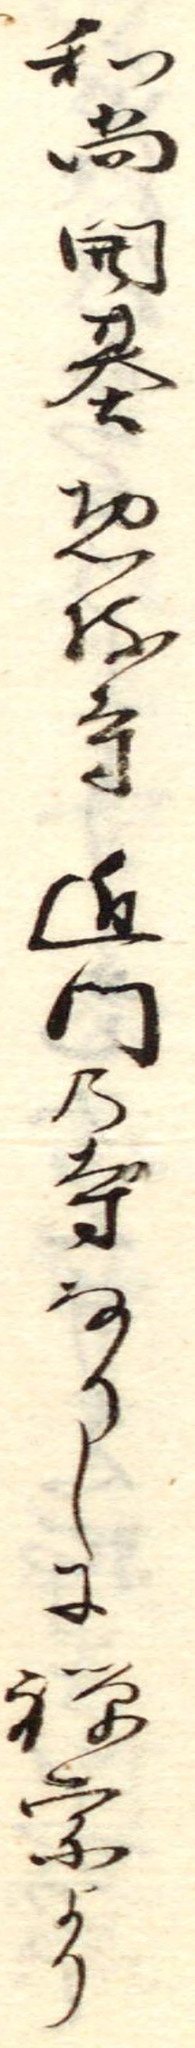和尚開基惣持寺近門の寺なりしに禅宗より
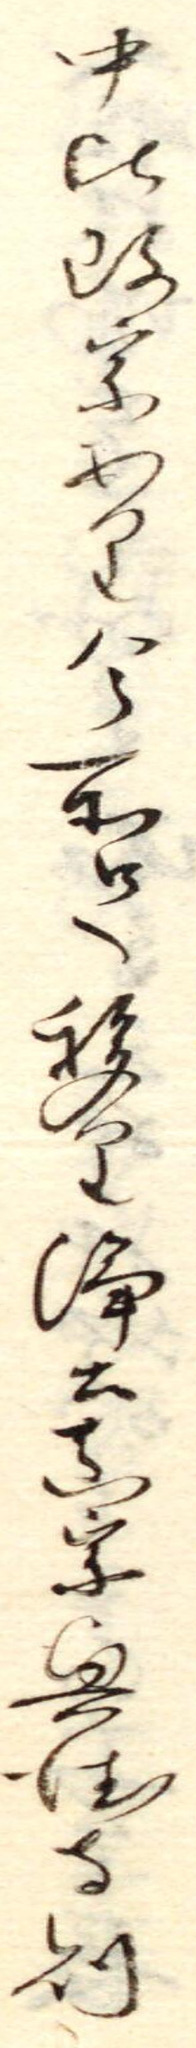中比改宗あり所口へ移り浄土真宗興徳寺則
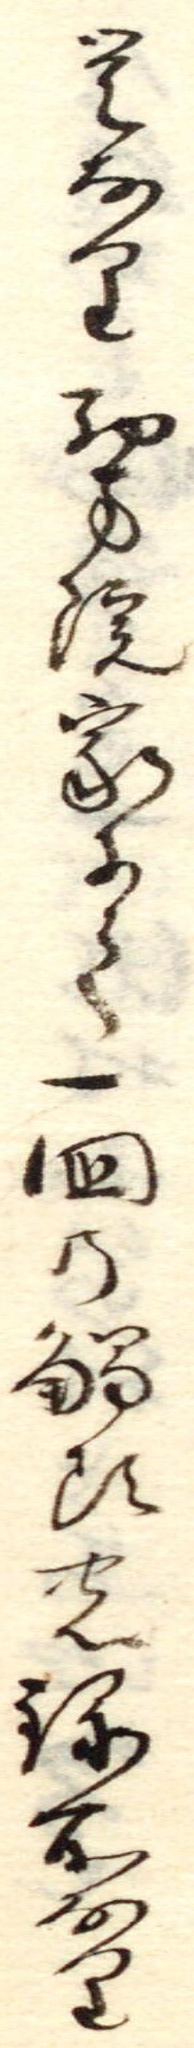是なり西方院家にて一国の触頭の録所なり
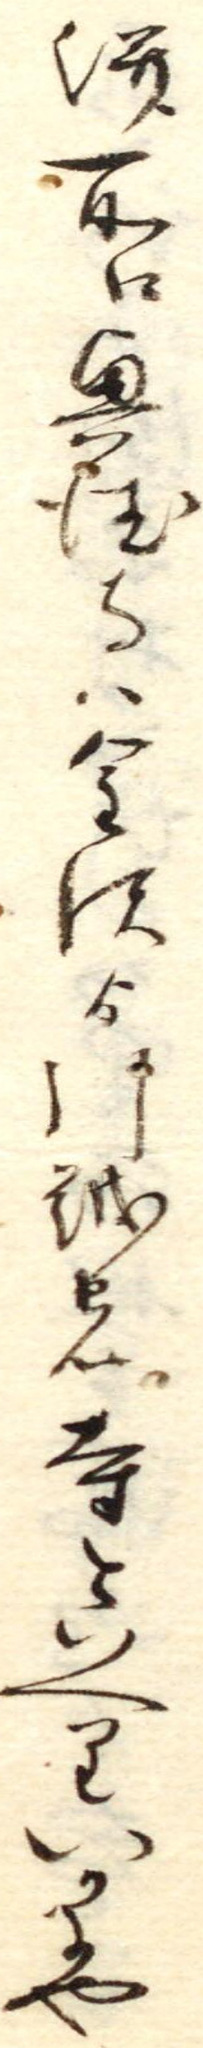併所口興徳寺は金沢ゟ引越の寺といへりいかにや
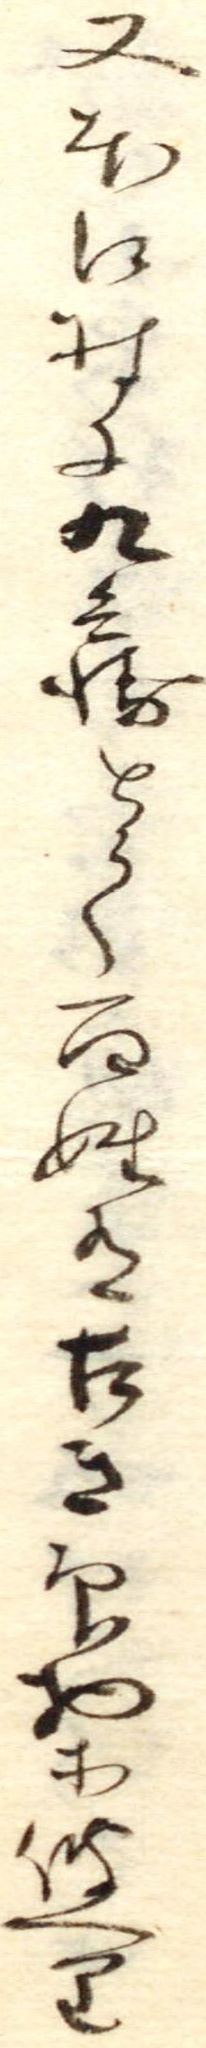又本口村に九兵衛とて百姓有古き印物等伝へり
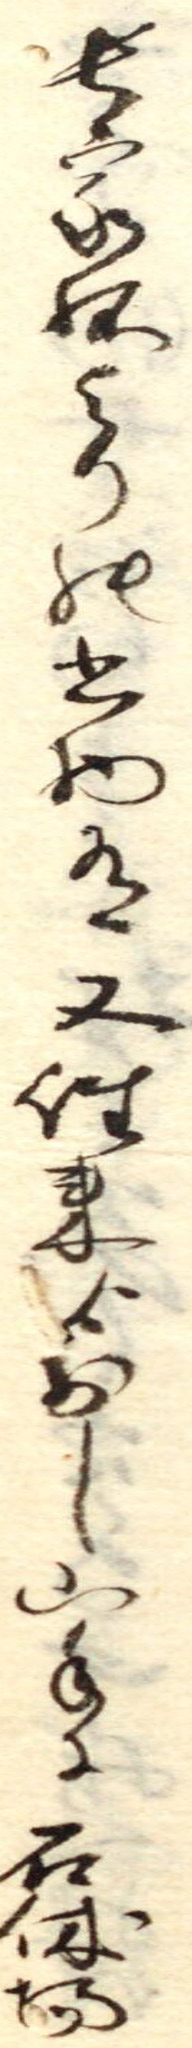長家抔よりの書物有又往来ゟ少し山手に石体場
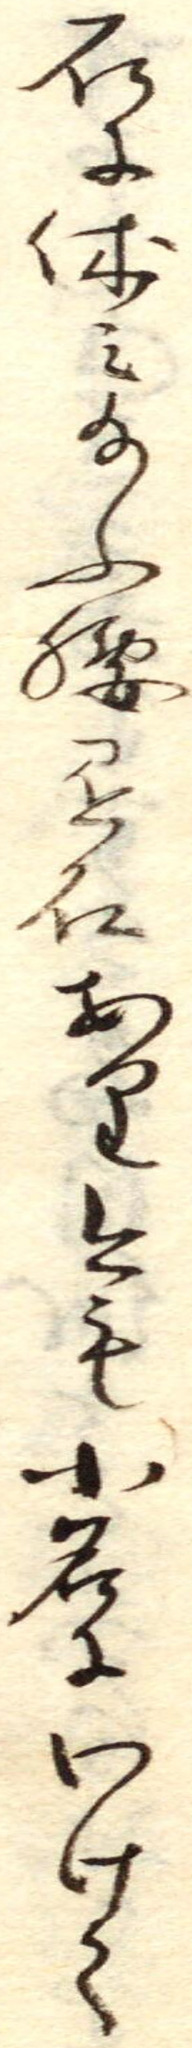石に休み給ふ腰懸石あり今も小名にわけて
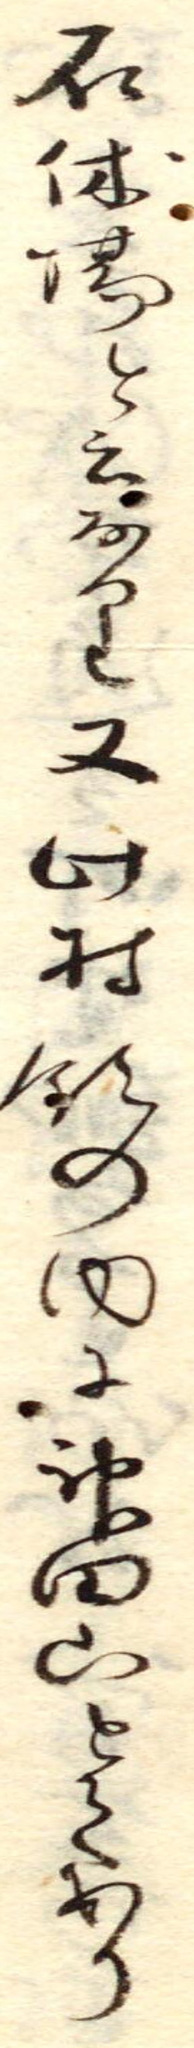石休場と言なり又此村領の内に神田山とてあり
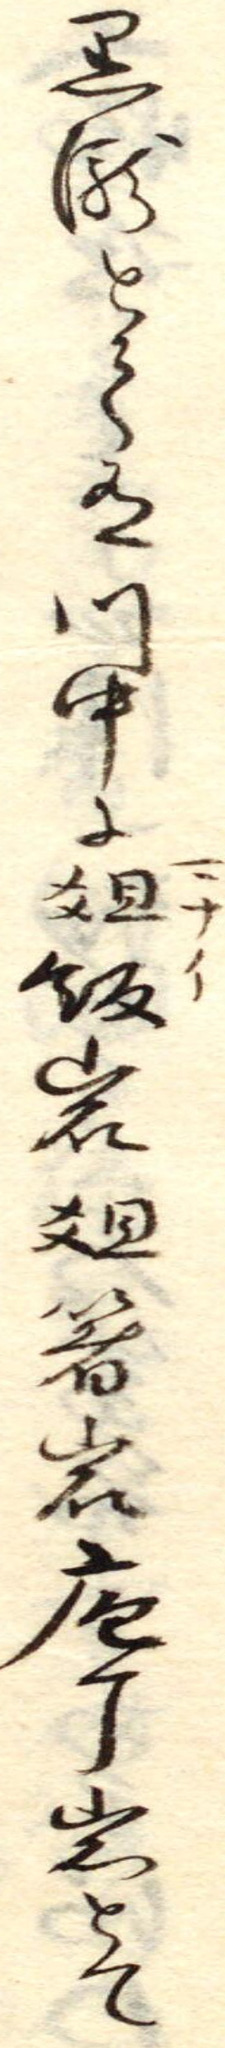黒瀧とて有川中に俎飯岩俎箸岩庖丁岩とて
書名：能登名跡誌
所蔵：Ishikawa Prefectural Library
